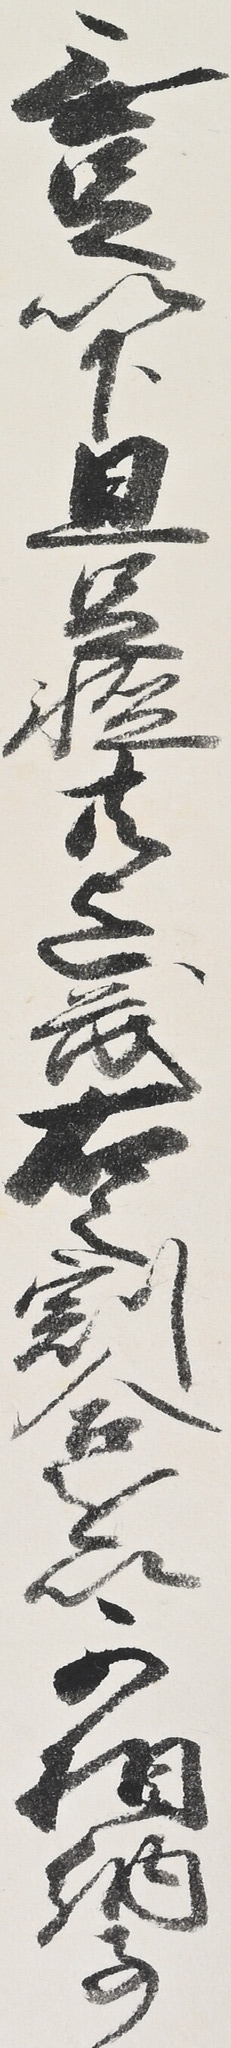無足以下且足軽共迄も右之割合を以可相納事
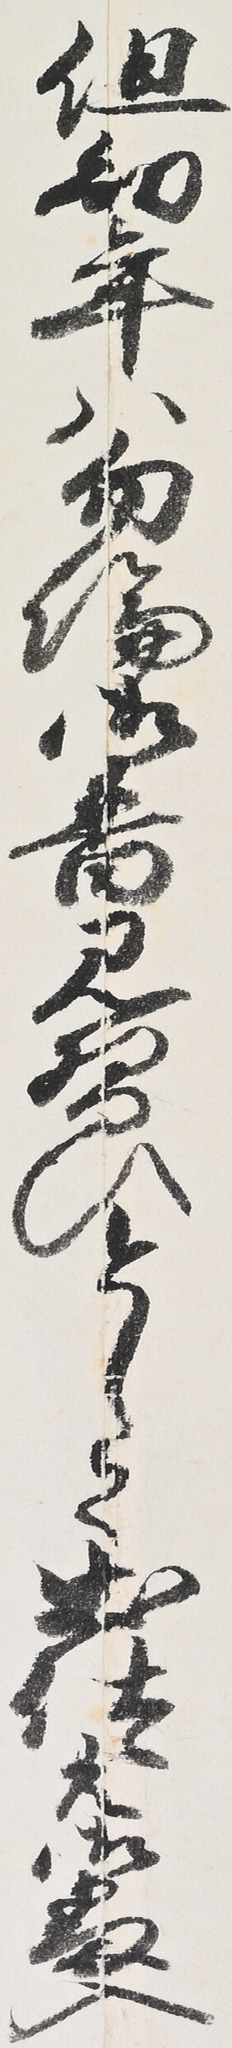但幼年ハ勿論御番見習ひとして出仕候共御番入
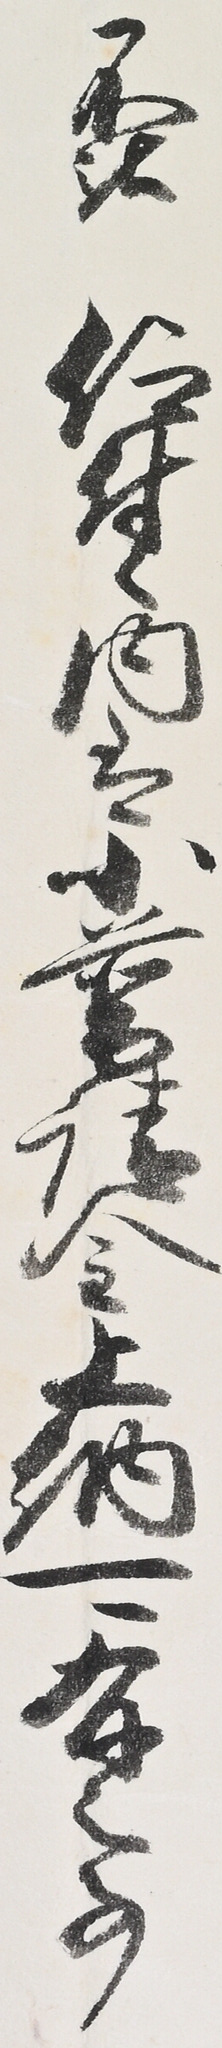不被仰付候内は小普請金上納可有之事
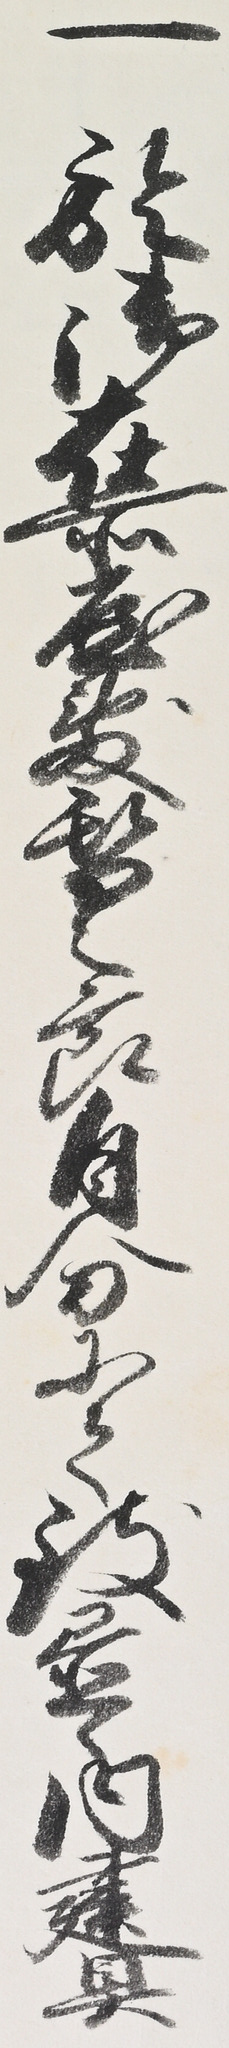一於御在所屋敷替之節自分にて致置候内建具
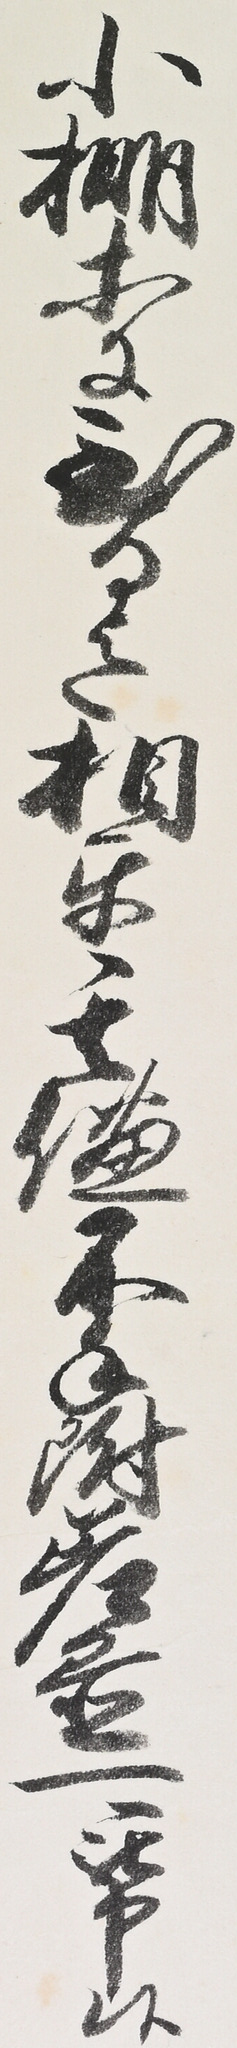小棚等に至る迄相互其儘不手附差置可被申候
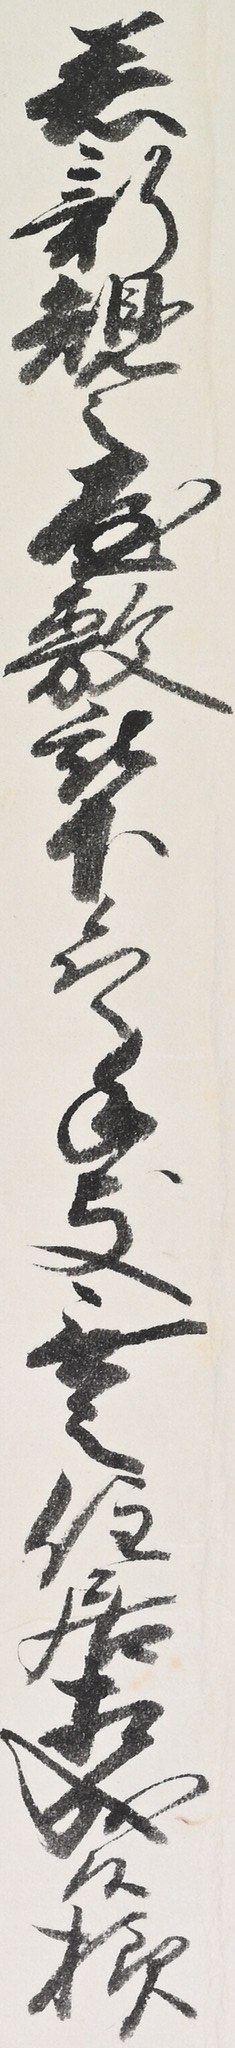若新規之屋敷被下候ハゝ手支無之住居相成候様
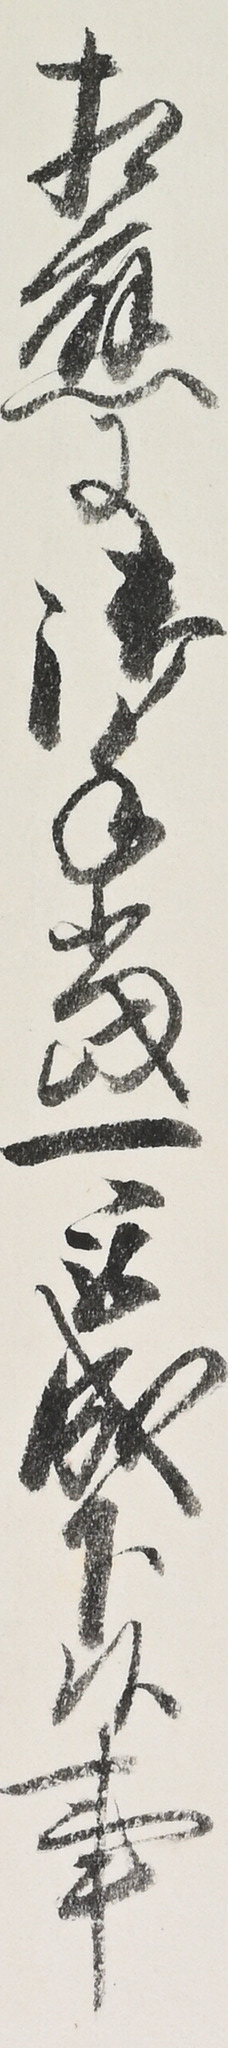相応に御手当可被成下候事

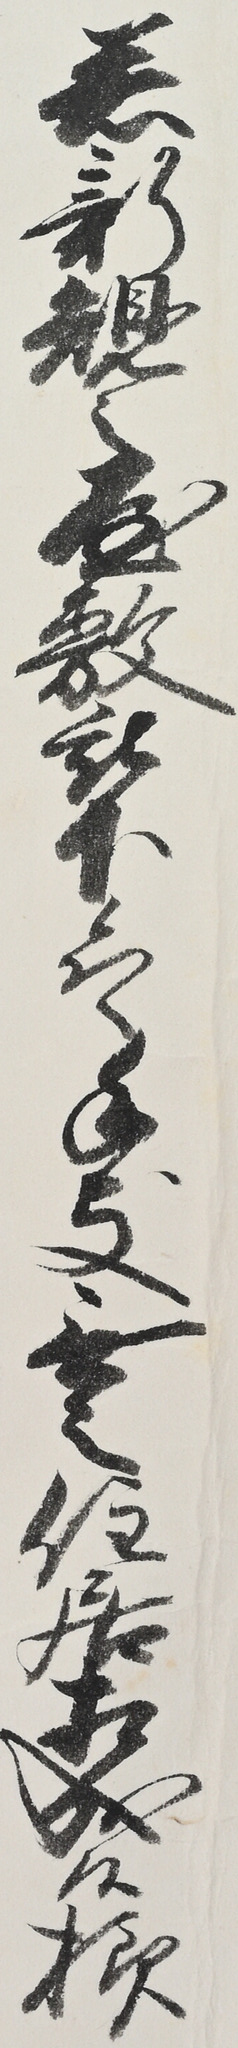若新規之屋敷被下候ハゝ手支無之住居相成候様
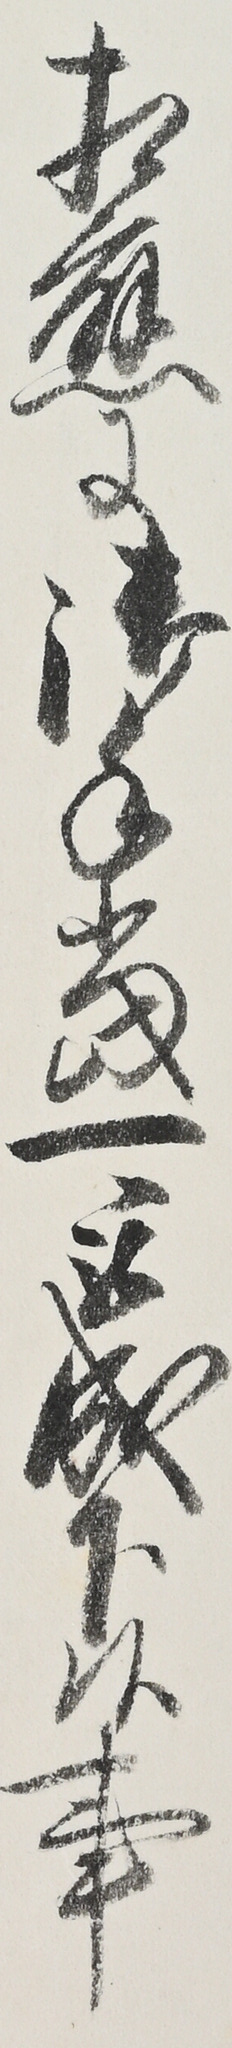相応に御手当可被成下候事
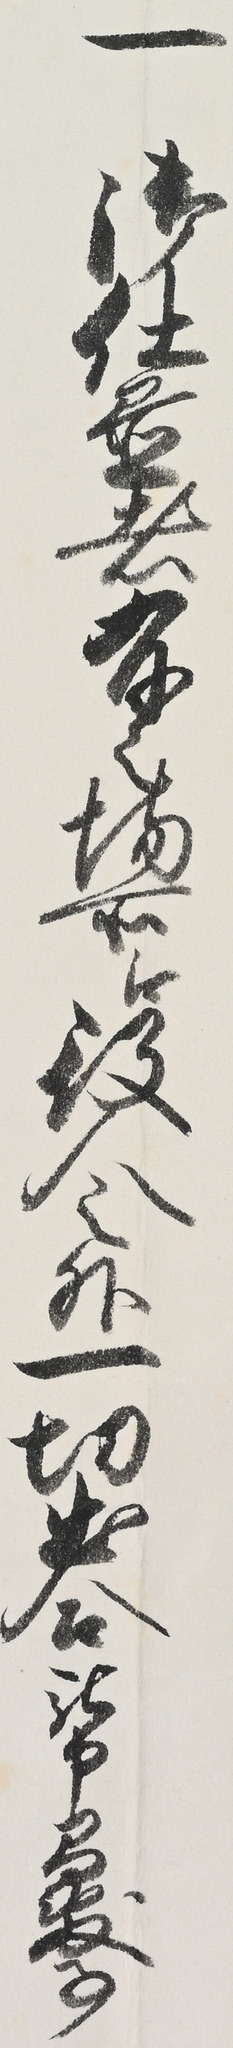一御仕置者有之場所え役人之外一切出合被申間敷事
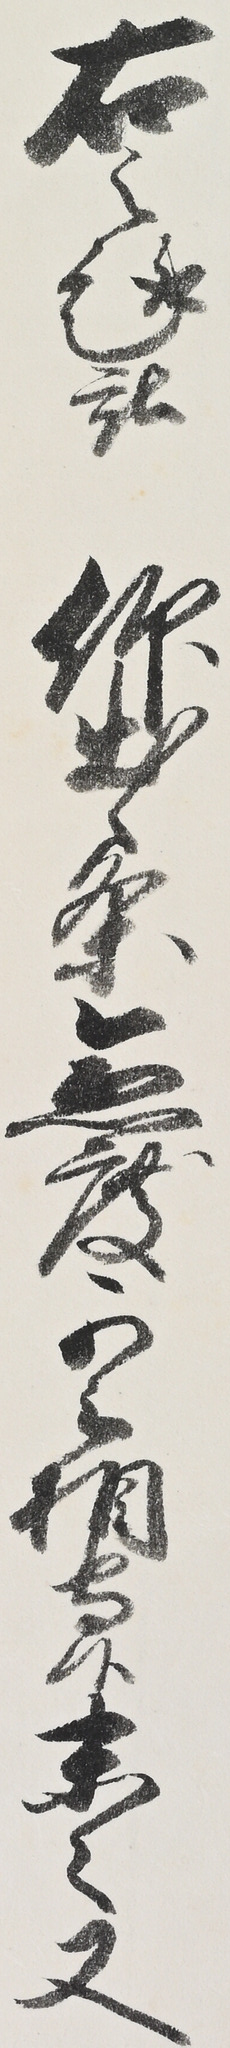右之趣被仰出候条急度可被守候末々又
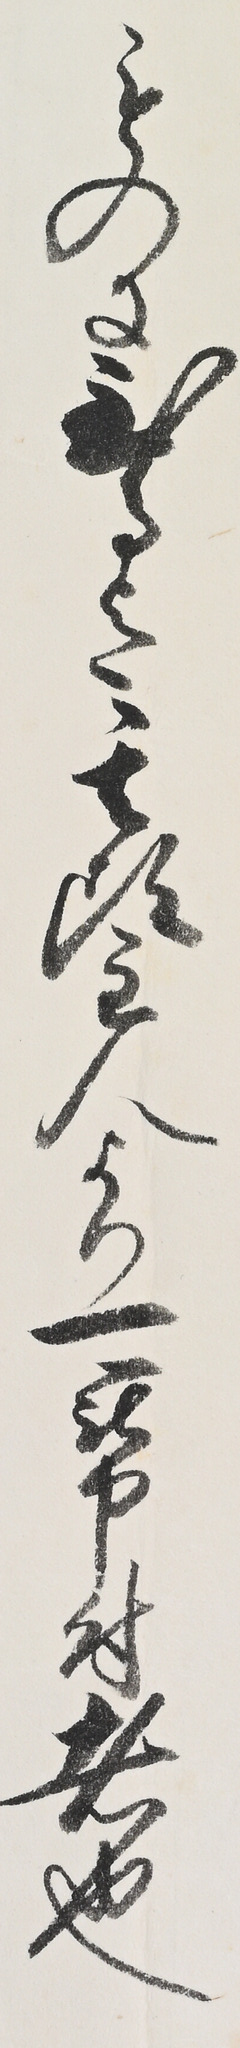ものに至る迄其頭主人より可被申付者也
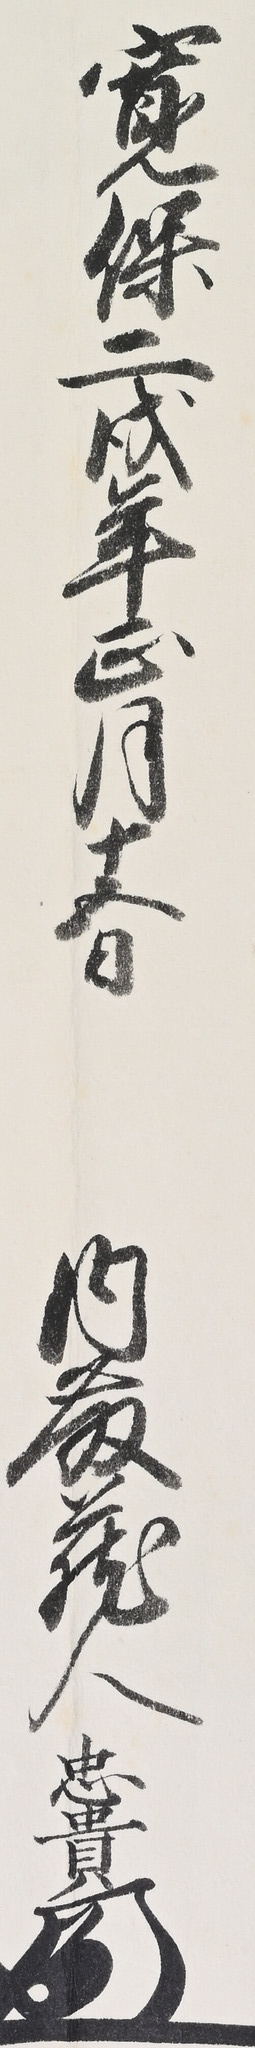寛保二戌年正月十五日内藤蔵人忠貴
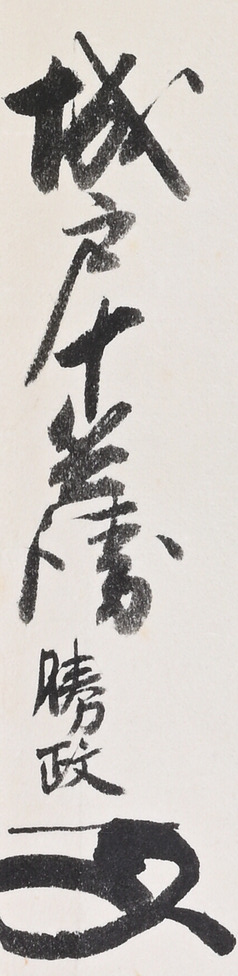城戸十兵衛勝政

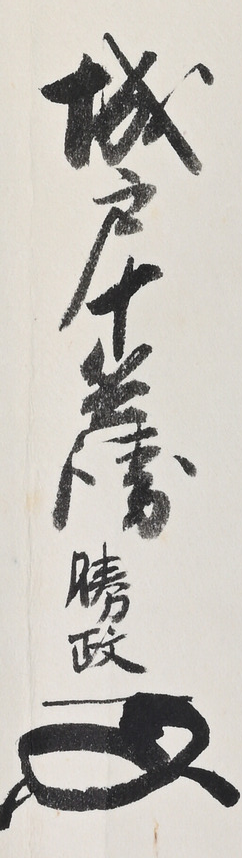城戸十兵衛勝政
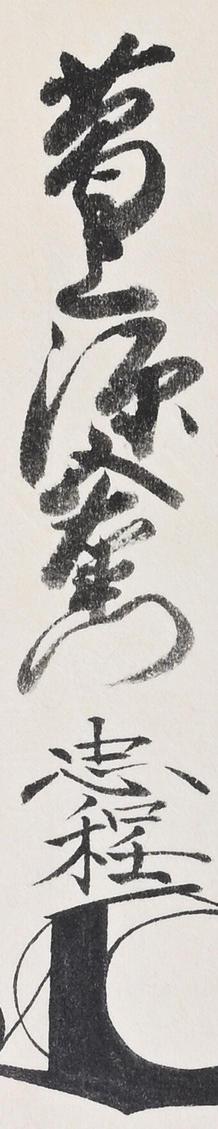葛上源五右衛門忠程
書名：仰書覚
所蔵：伊那市立高遠町図書館・合同会社AMANE
